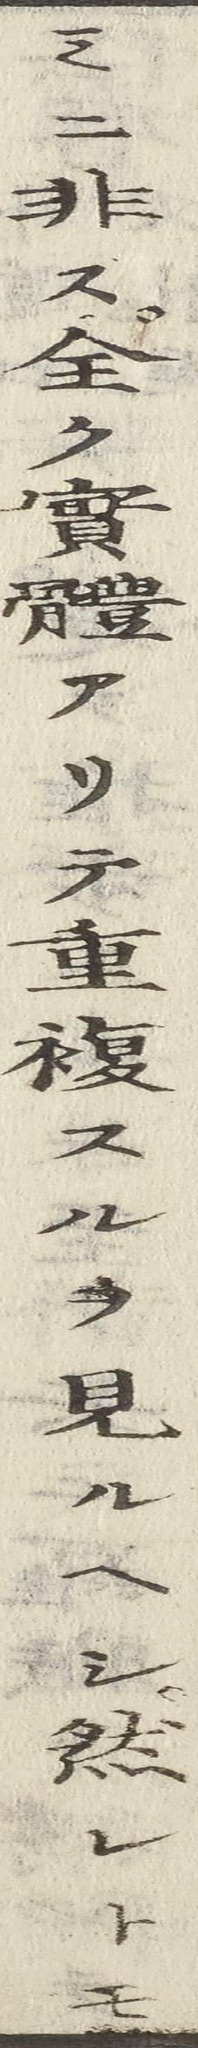ミニ非ス。全ク実体アリテ重複スルヲ見ルヘシ。然レトモ
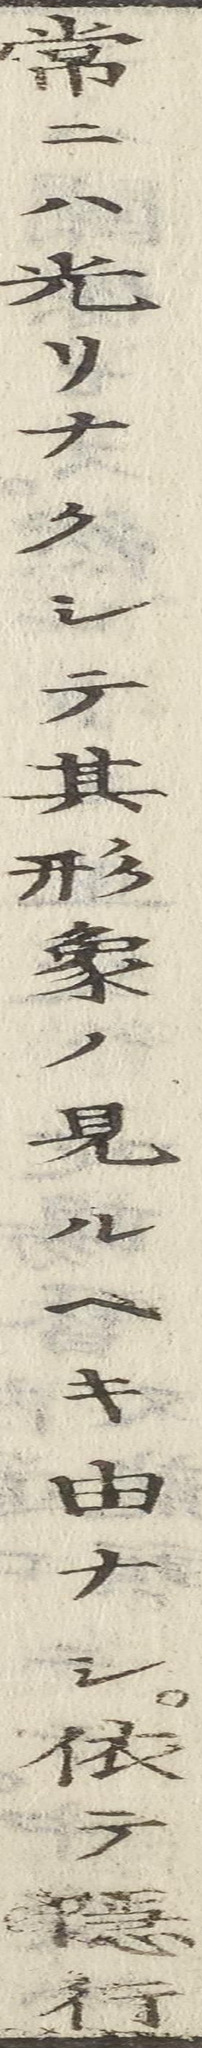常ニハ光リナクシテ其形象ノ見ルヘキ由ナシ。依テ隠行
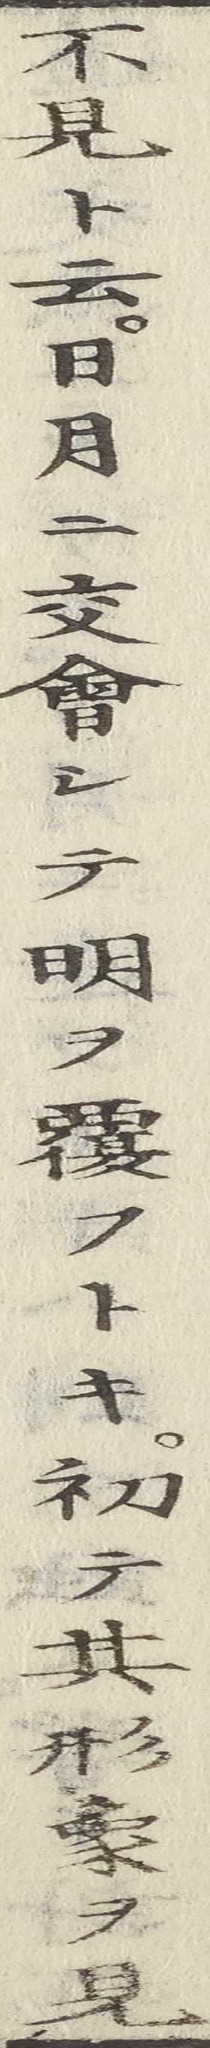不見ト云。日月ニ交会シテ明ヲ覆フトキ。初テ其形象ヲ見
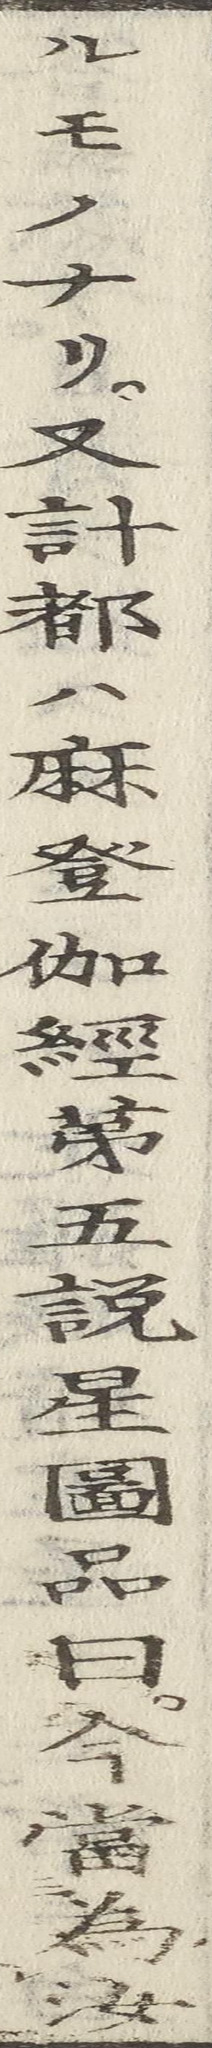ルモノナリ。又計都ハ麻登伽経第五説星図品曰。今当ニ為汝
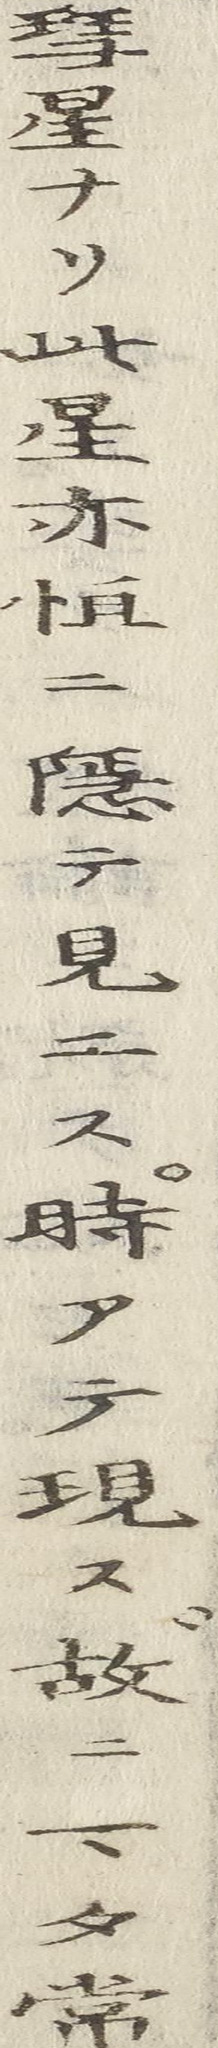彗星ナリ此星亦恒ニ隠テ見エス。時アテ現ス。故ニマタ常
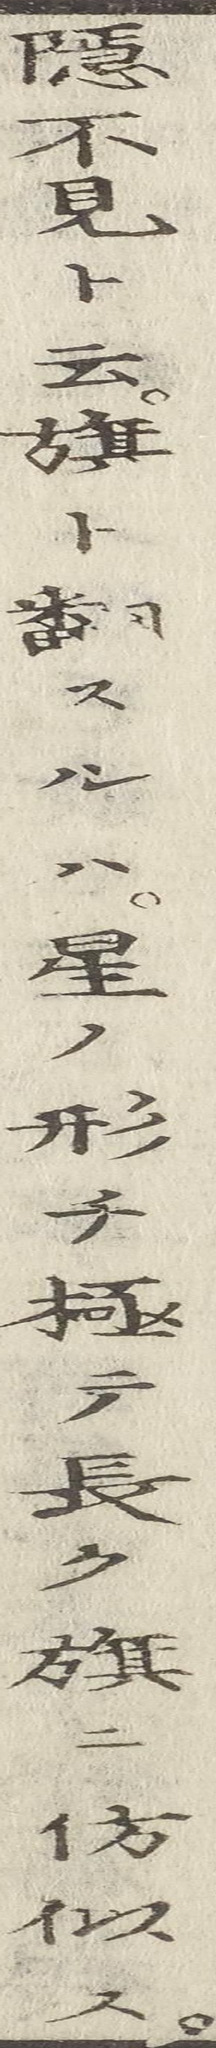隠不見ト云。旗ト翻スルハ。星ノ形チ極テ長ク旗ニ仿似ス。
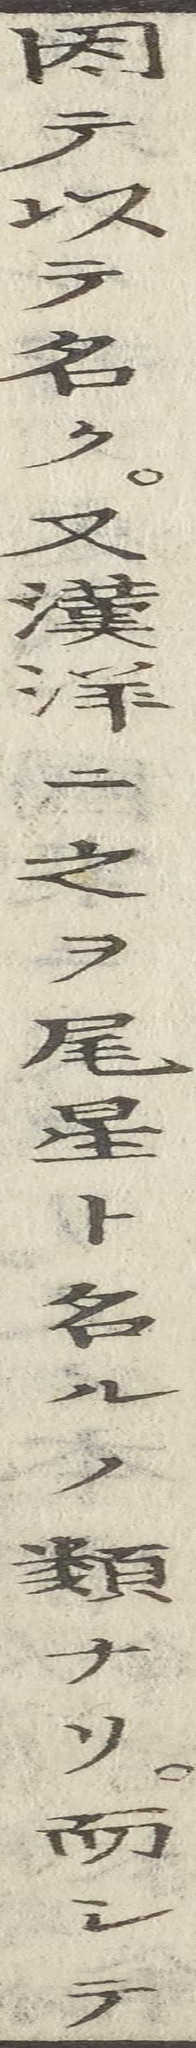因テ以テ名ク。又漢洋ニ之ヲ尾星ト名ルノ類ナリ。而シテ

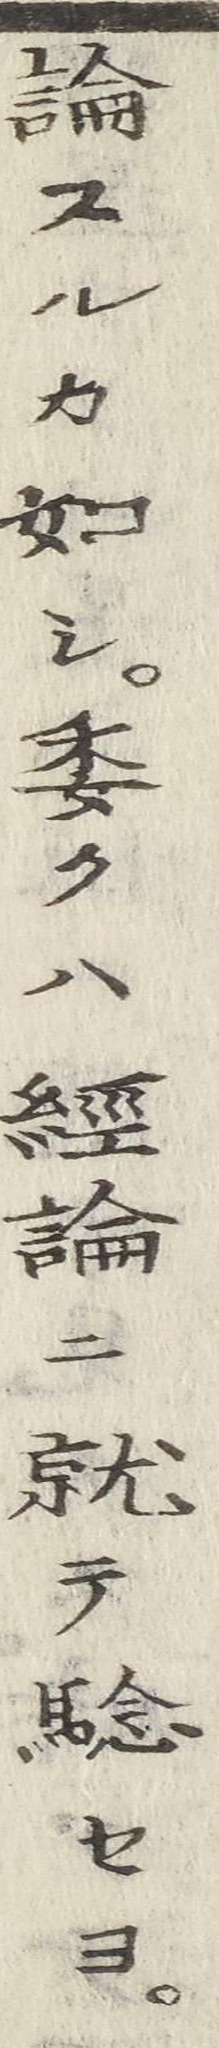論スルカ如シ。委クハ経論ニ就テ騐セヨ。
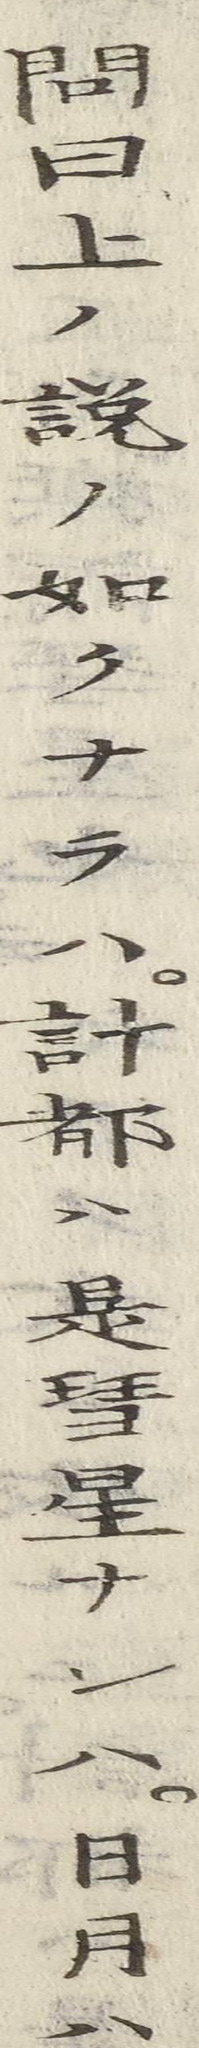問曰上ノ説ノ如クナラハ。計都ハ是彗星ナレハ。日月ハ
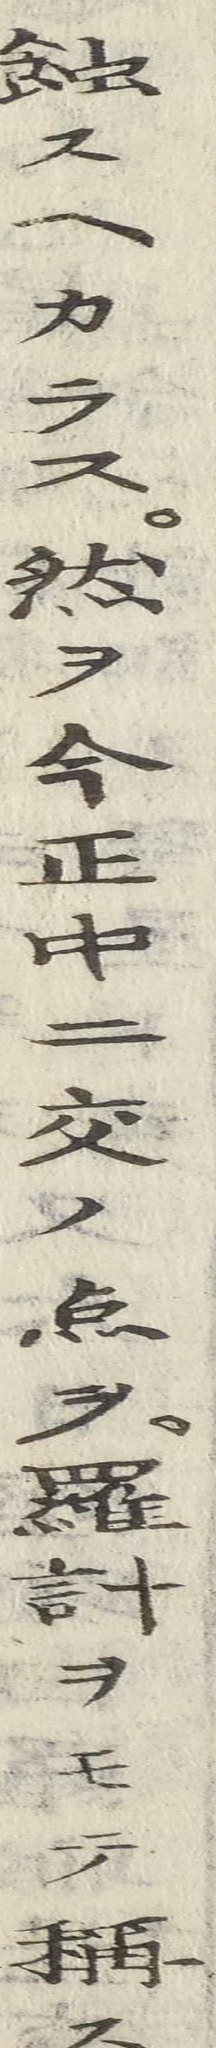蝕スヘカラス。然ヲ今正中ニ交ノ点ヲ。羅計ヲモテ称ス
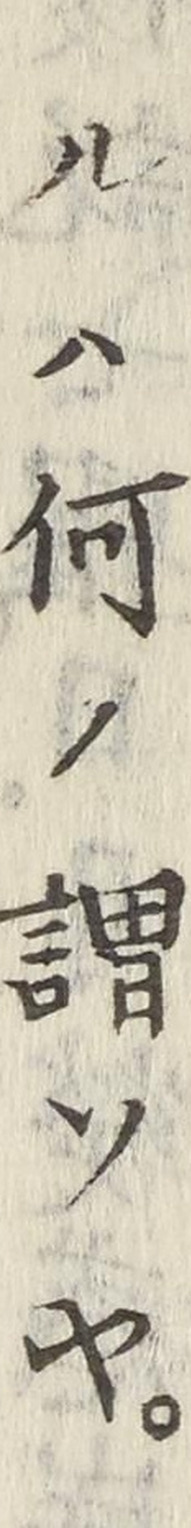ルハ何ノ謂ソヤ。
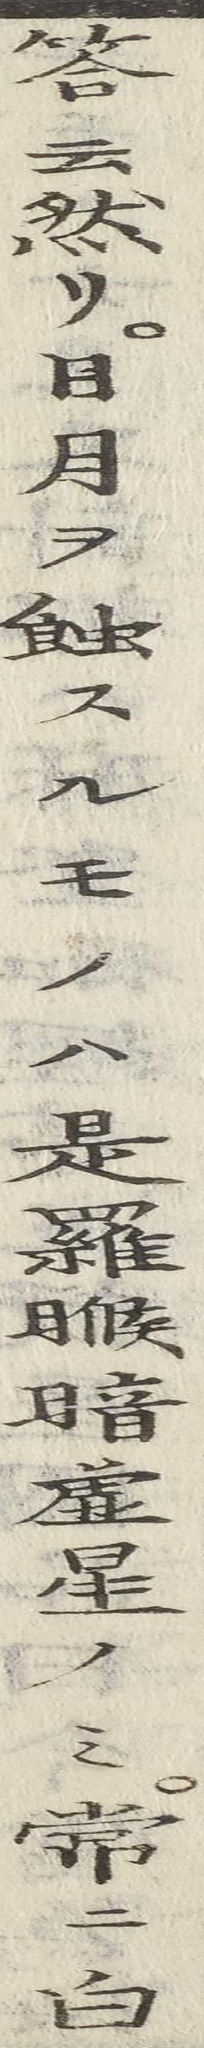答云然リ。日月ヲ蝕スルモノハ是羅睺暗虚星ノミ。常ニ白
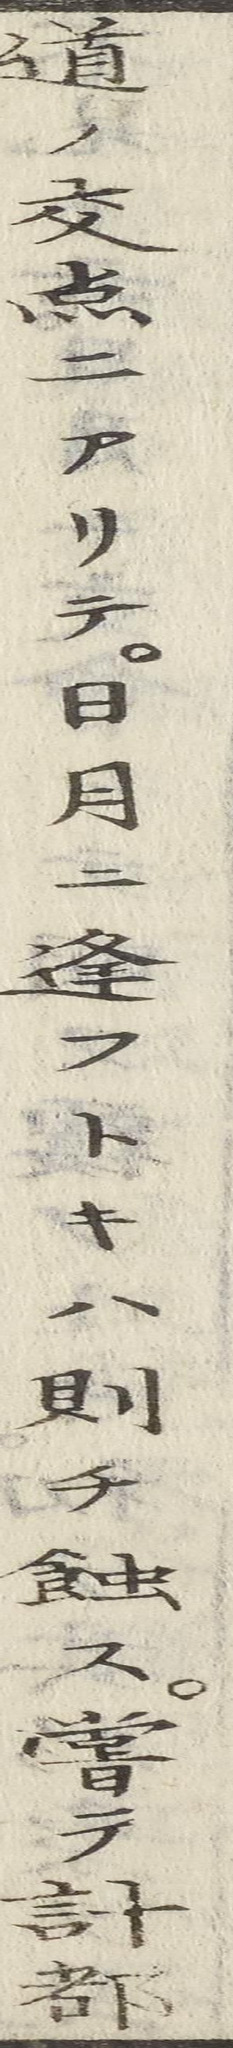道ノ交点ニアリテ。日月ニ逢フトキハ則チ蝕ス。嘗テ計都
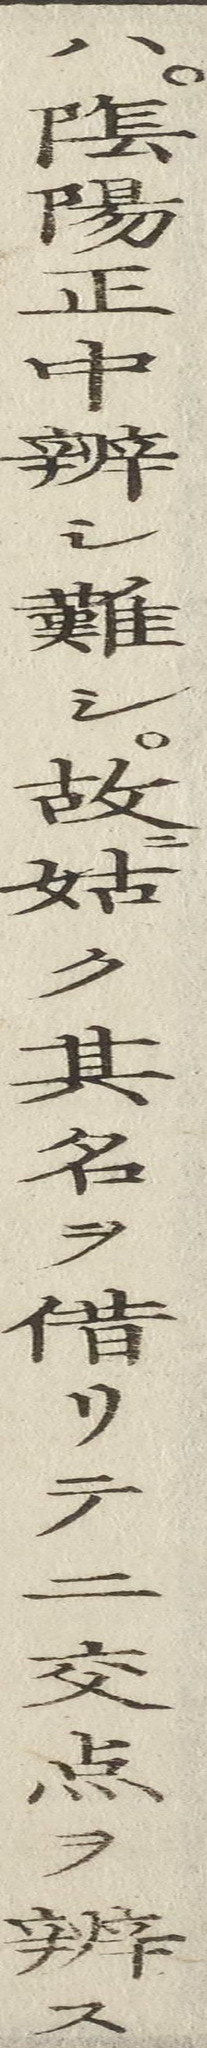ハ。陰陽正中弁シ難シ。故姑ク其名ヲ借リテニ交点ヲ弁ス
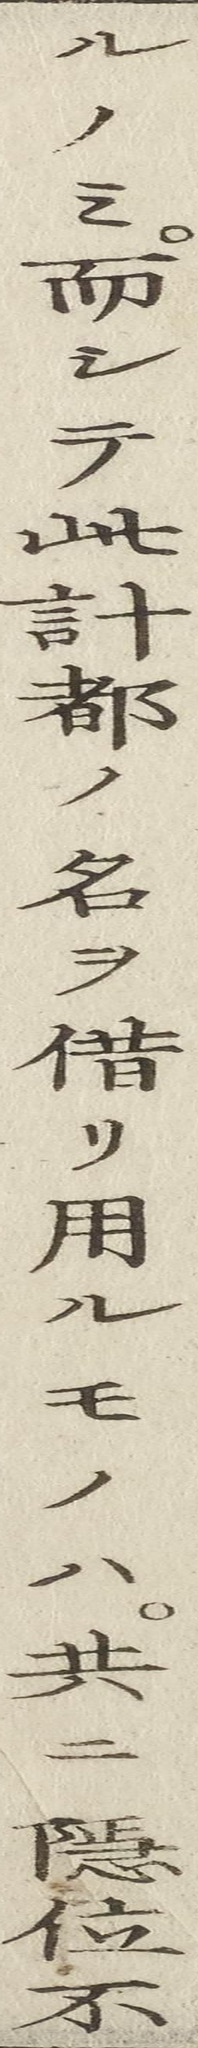ルノミ。而シテ此計都ノ名ヲ借リ用ルモノハ。共ニ隠位不
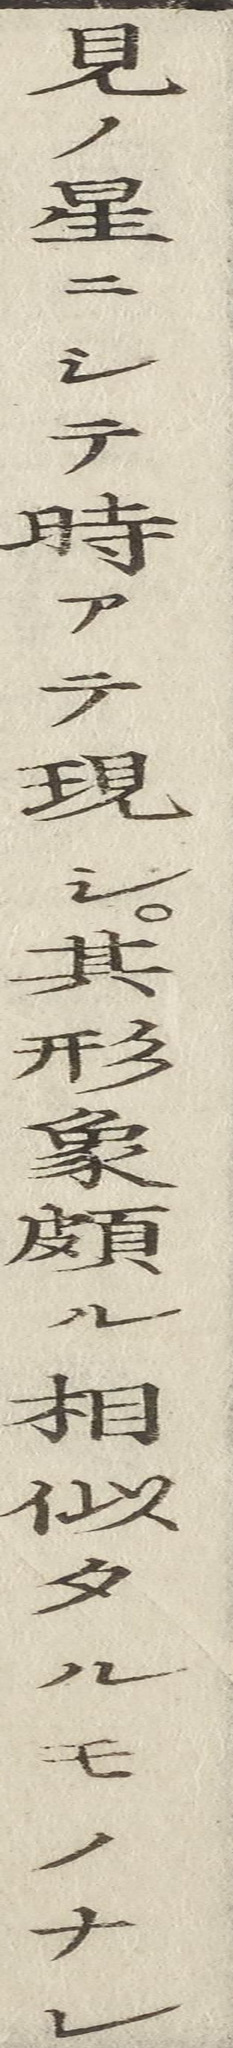見ノ星ニシテ時アテ現シ。其形象頗ル相似タルモノナレ
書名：護法新論　二編　下
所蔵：東京大学地震研究所図書室 Earthquake Research Institute Library, The University of Tokyo, JAPAN
